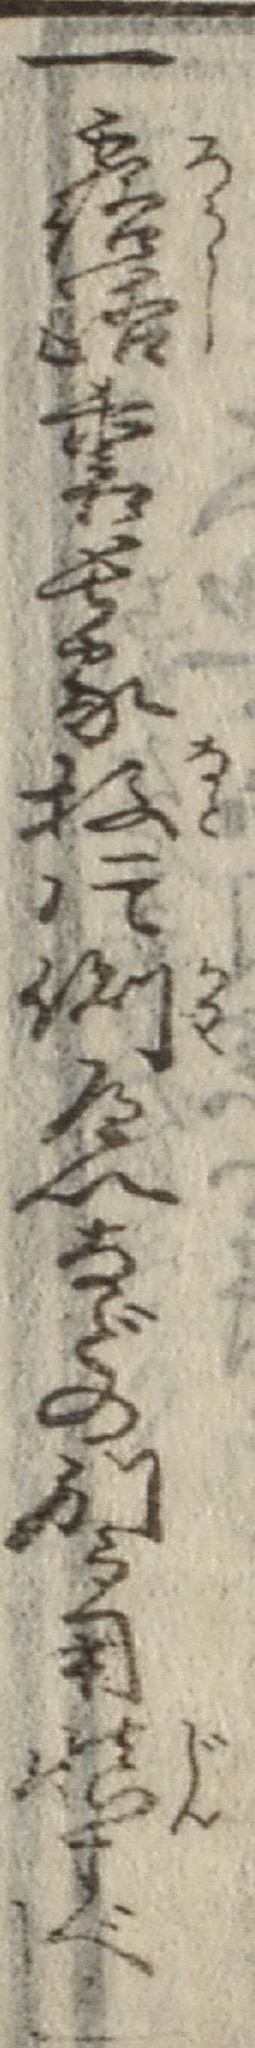一露路裏長家抔片側へいなどの別而用慎すべし
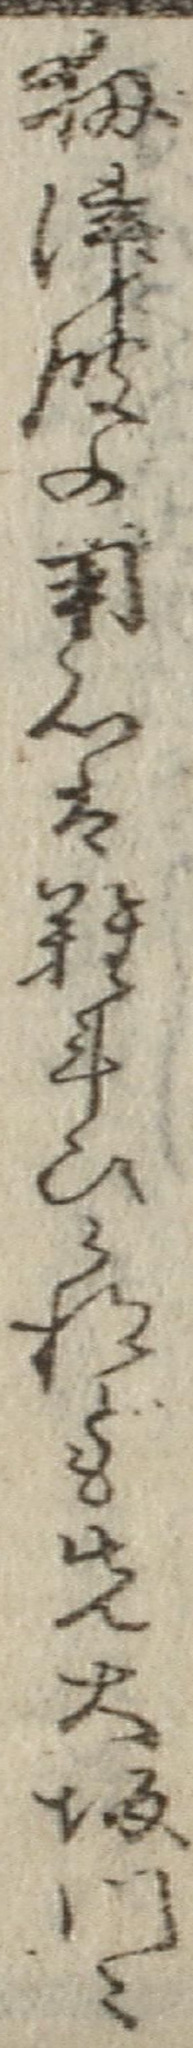扨津波の用心は難斗ひ候得とも先大坂川〻
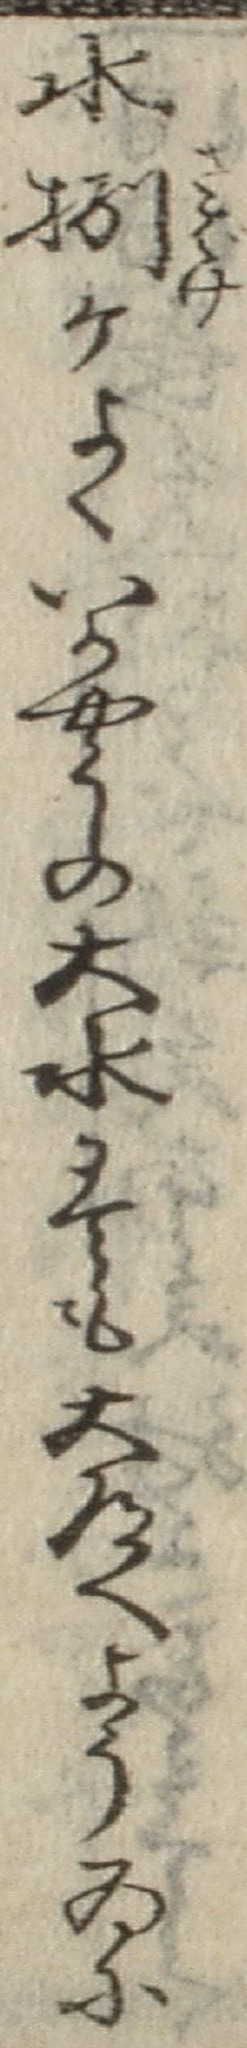水捌ケよくいかやうの大水にても大道へようゐに
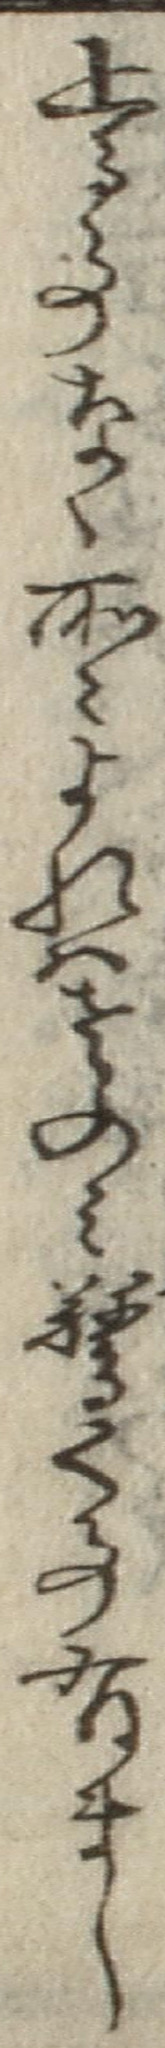止る事なく所ニよれハさのミ驚く事有まし
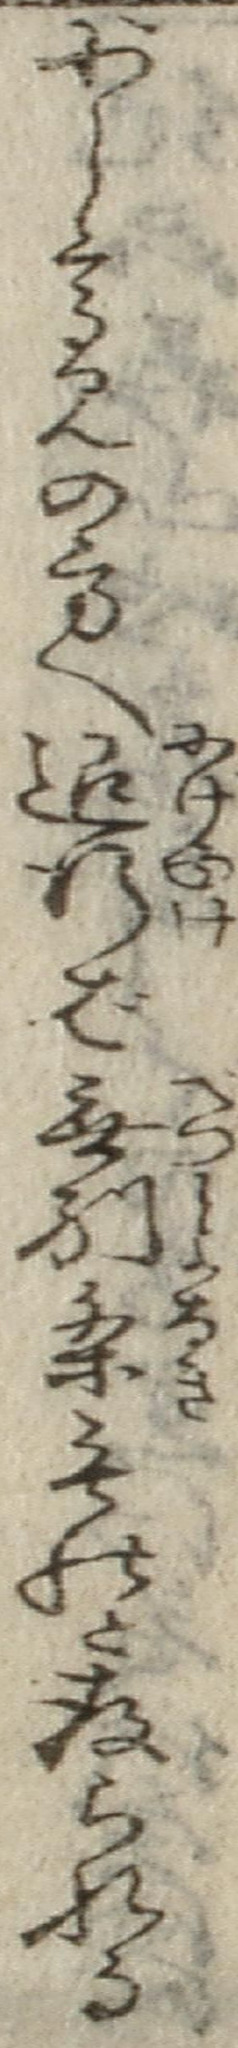少し高見の方へ逃行ば無別条ものと存られる
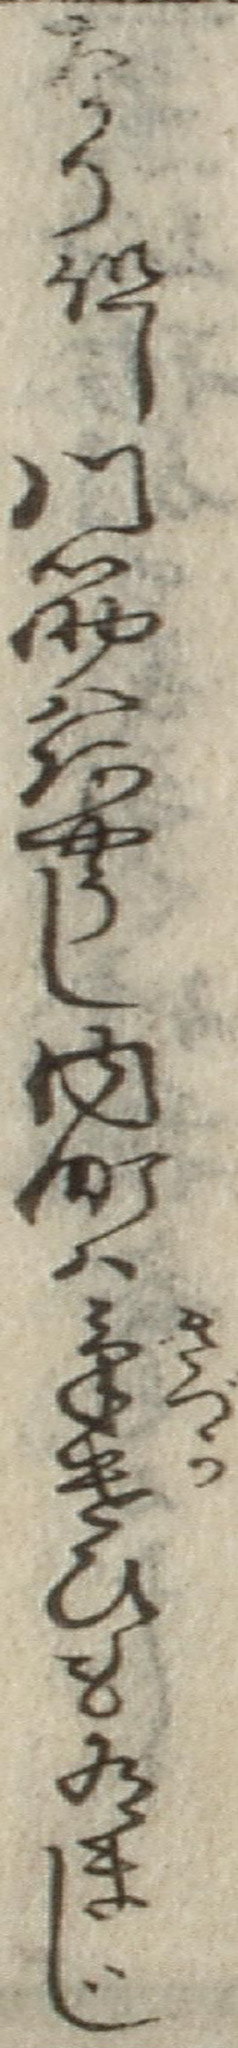なり但し川筋ハあやうし内町ハ気遣ひも有まじ
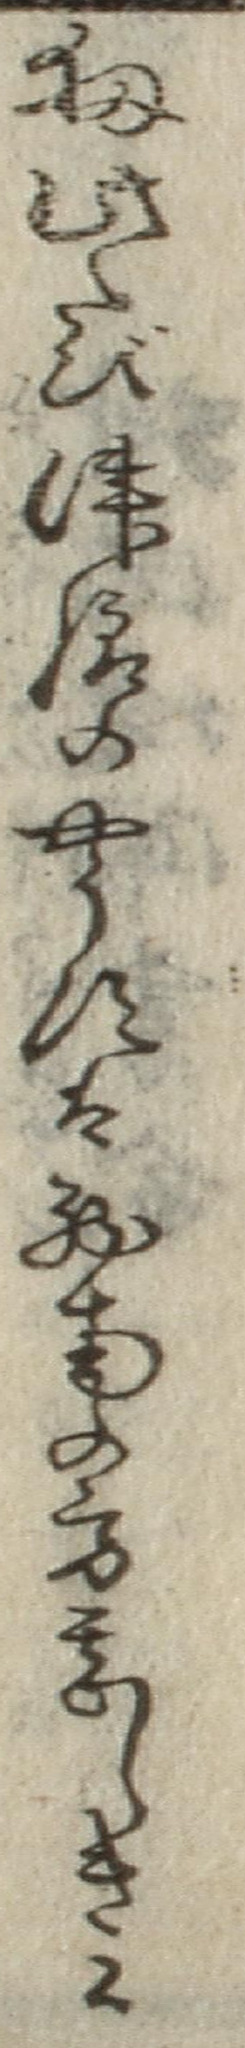扨此たび津浪のやうすは西南の方甚しき候
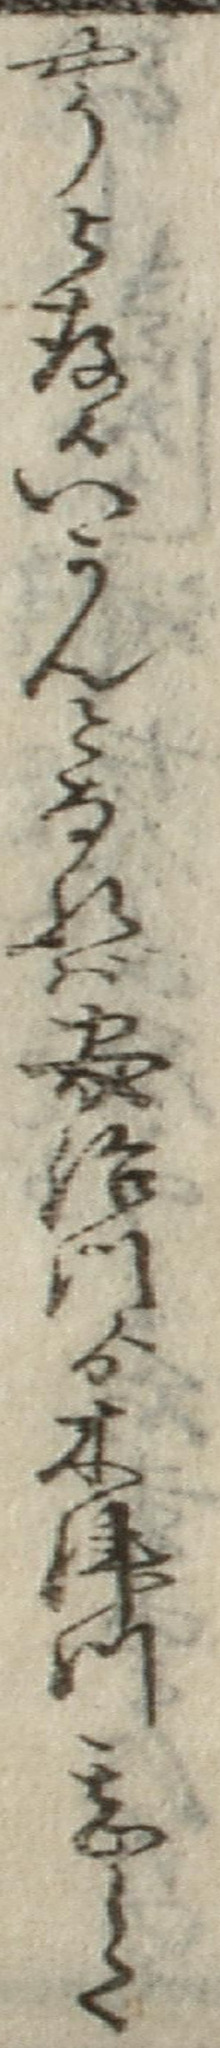やうと存候いかんとなれバ安治川ゟ木津川甚しく
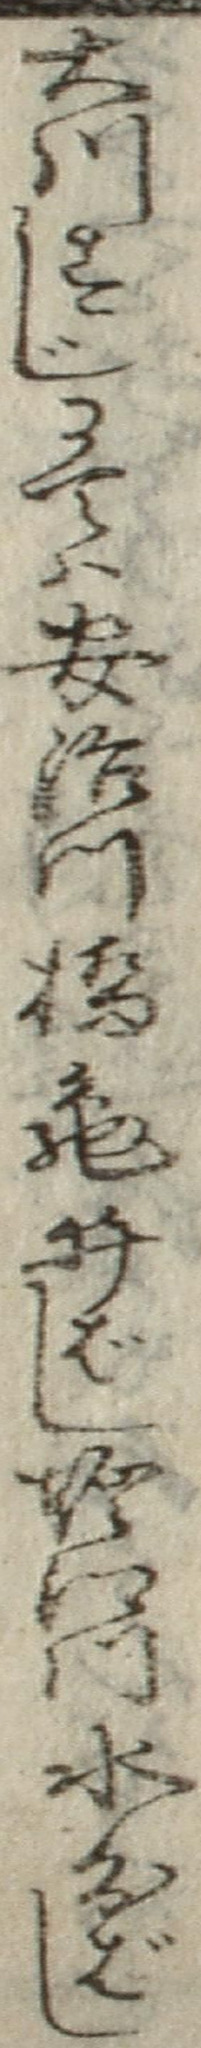大川すじにてハ安治川橋亀井ばし堀江川水分ばし

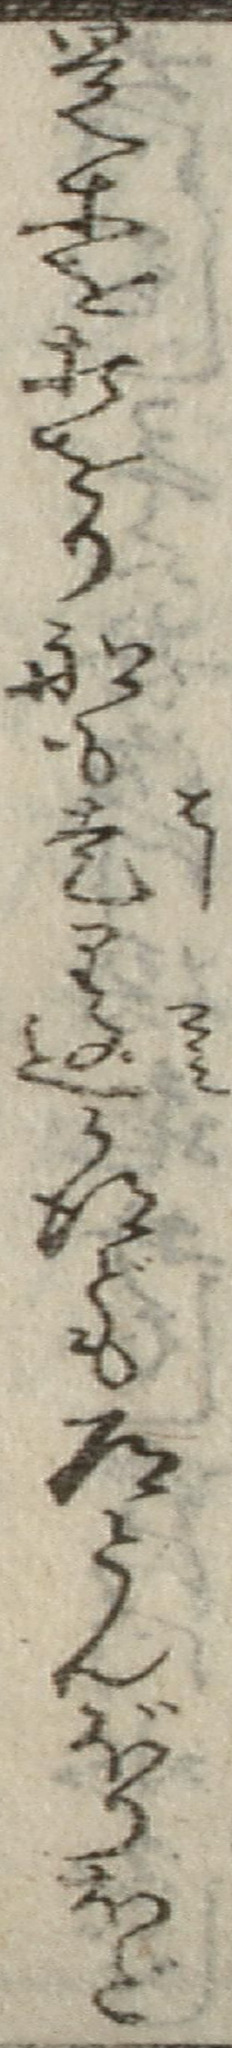是等を打をり船も走り込候得とも道とんぼりほど
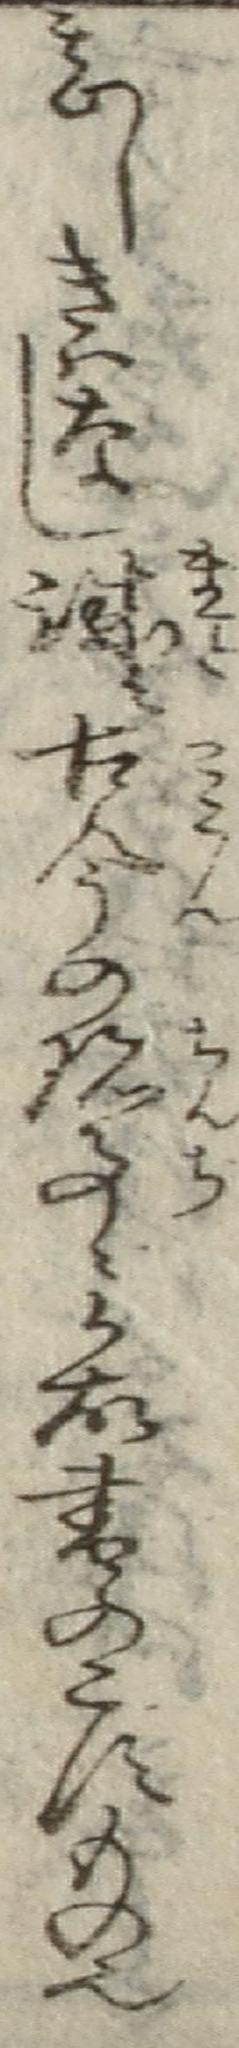甚しきハなし誠ニ古今の珍事ニ候故書のこすもの也
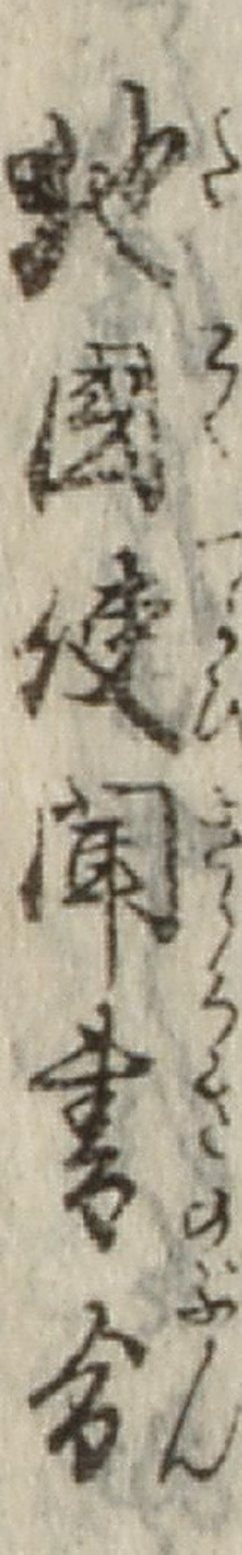他国使聞書分
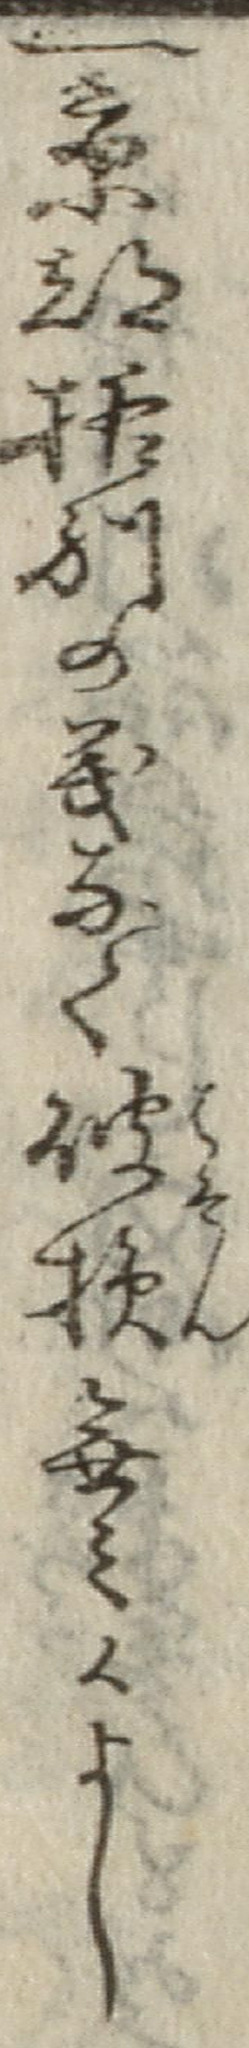一京都格別の義なく破損無之候よし
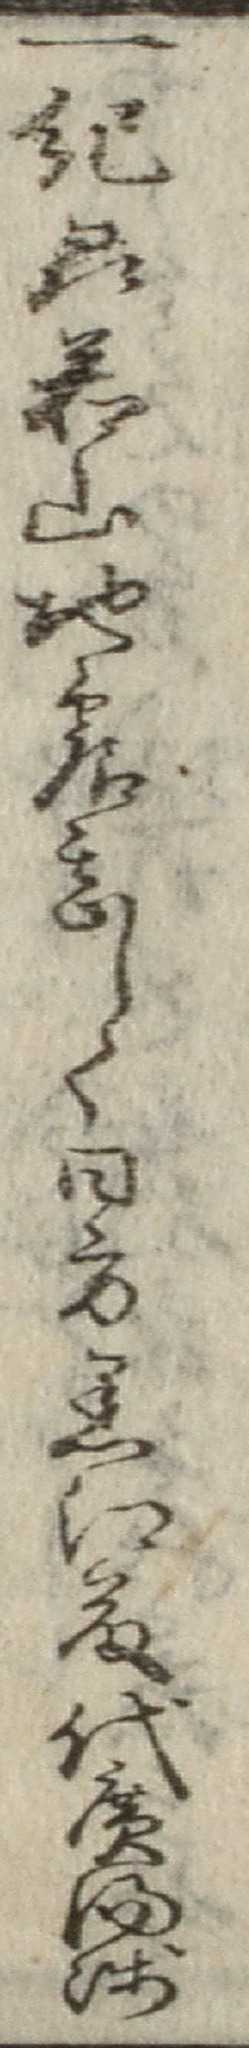一紀州若山地震甚しく日方黒江藤代広湯浅
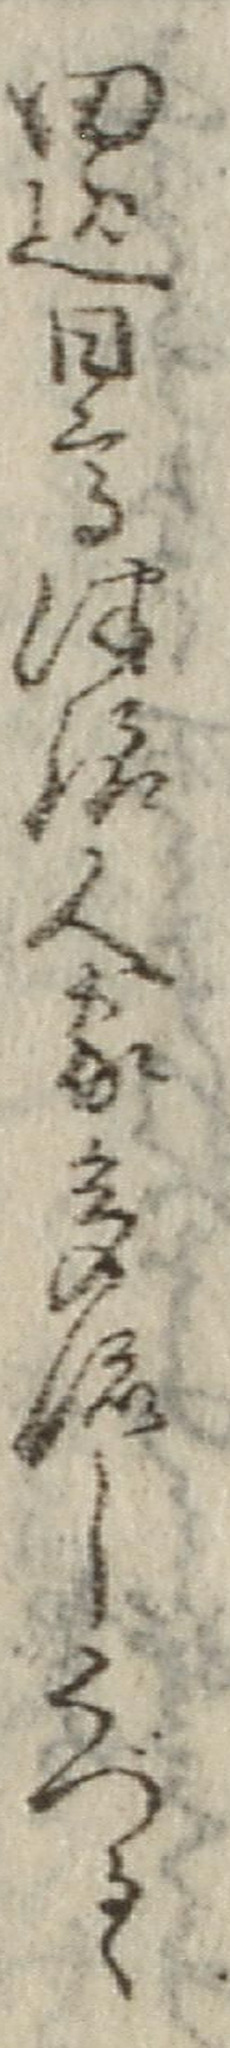田辺日高津浪人家多流しくづるゝ
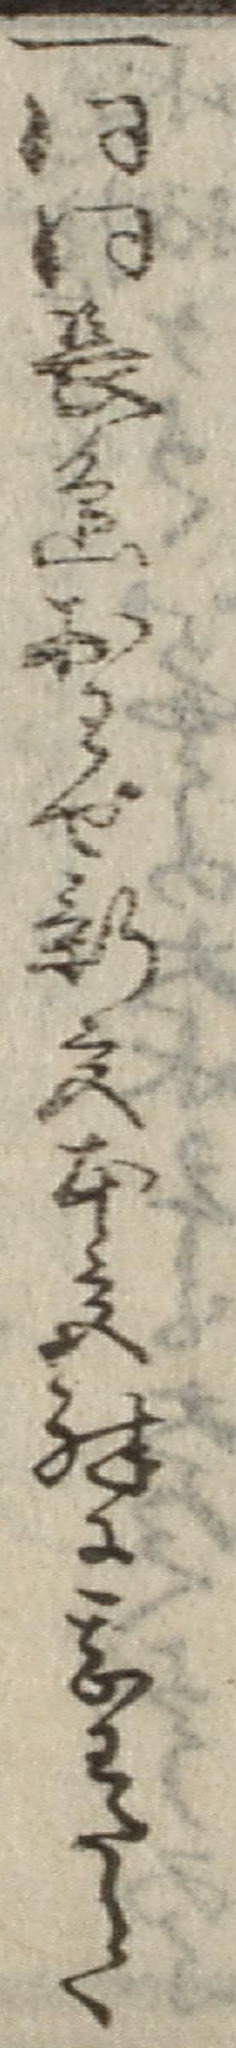一同日長島おわせ新宮本宮殊に甚わたしく
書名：世直り艸紙
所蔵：東京大学地震研究所図書室 Earthquake Research Institute Library, The University of Tokyo, JAPAN
